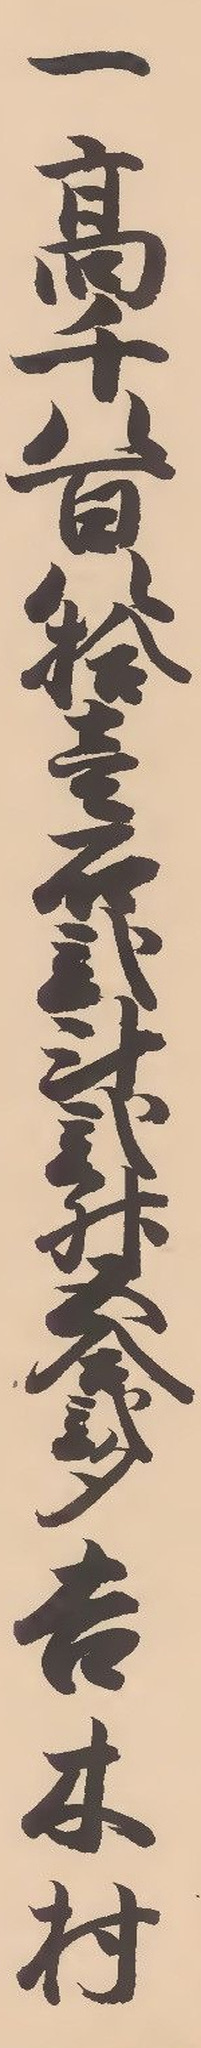一高千八百八拾壱石弐斗弐升五合弐勺吉木村
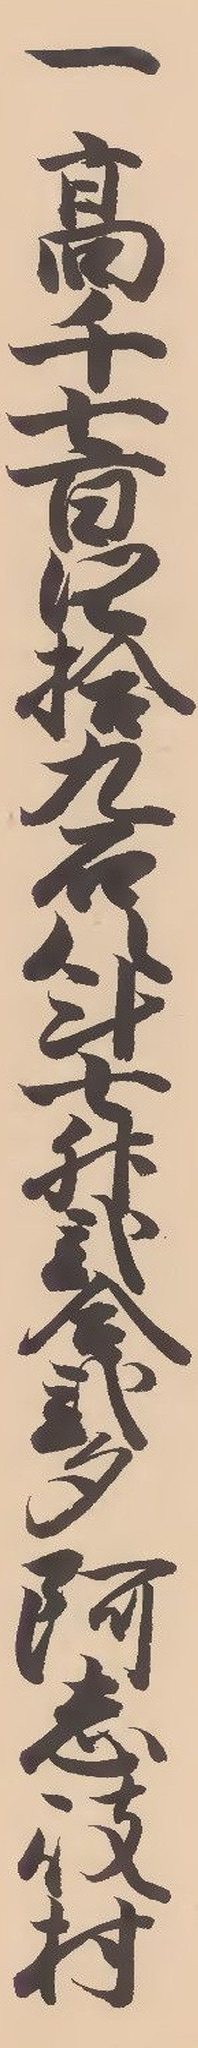一高千七百四拾九石八斗七升弐合弐勺阿志岐村

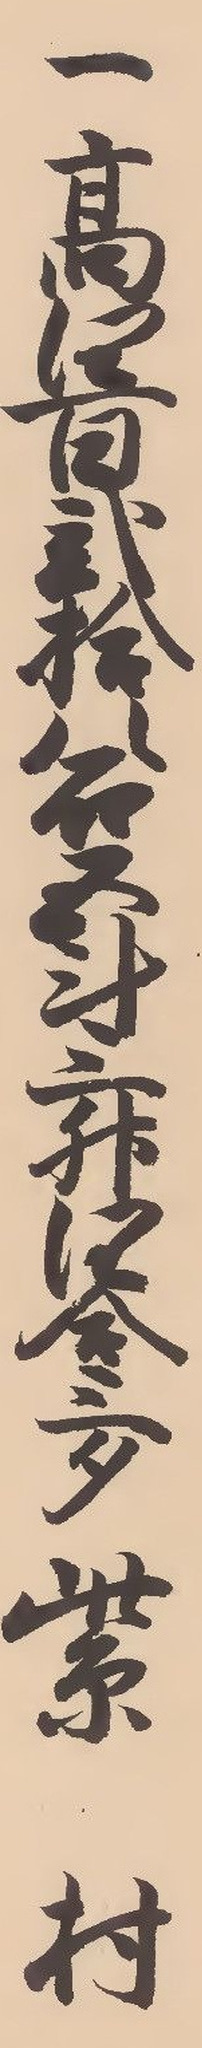一高四百弐拾八石五斗三升四合三勺紫村
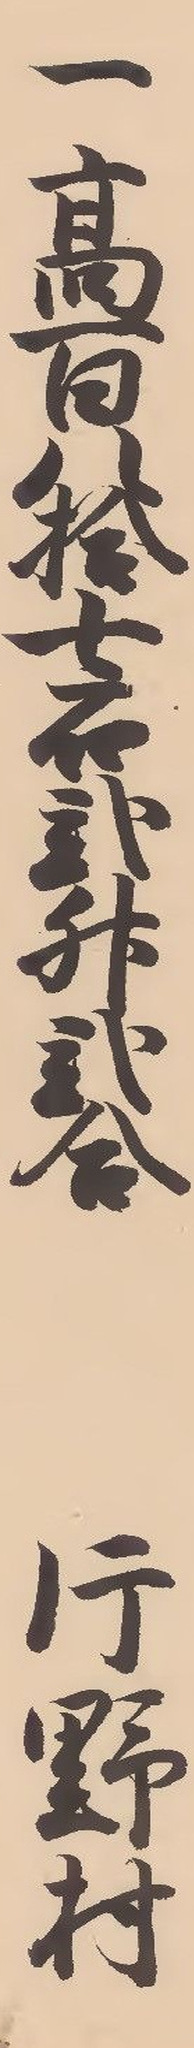一高百八拾七石弐升弐合片野村
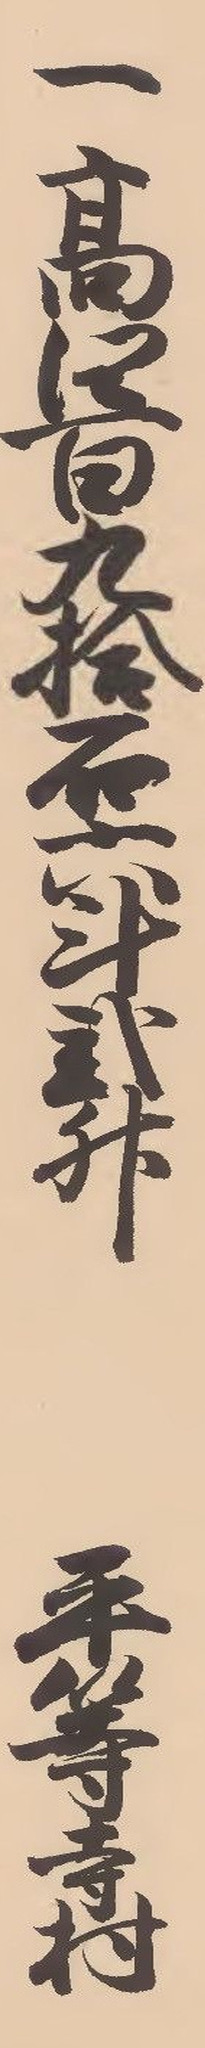一高四百九拾石六斗弐升平等寺村
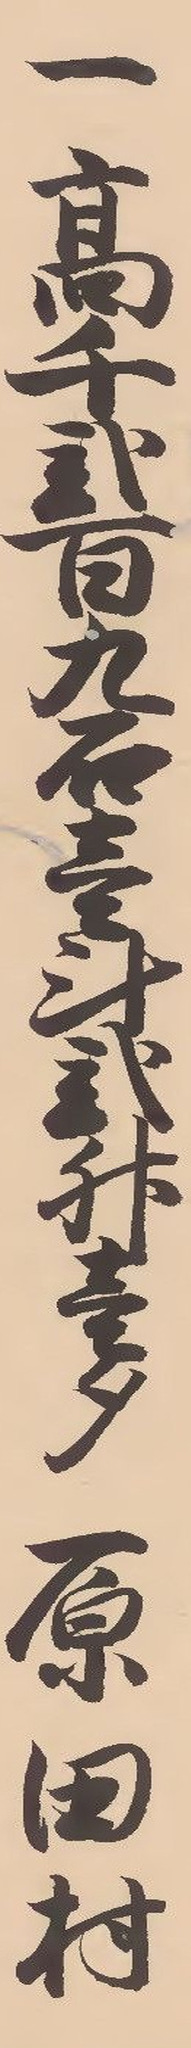一高千弐百九石壱斗弐升壱勺原田村
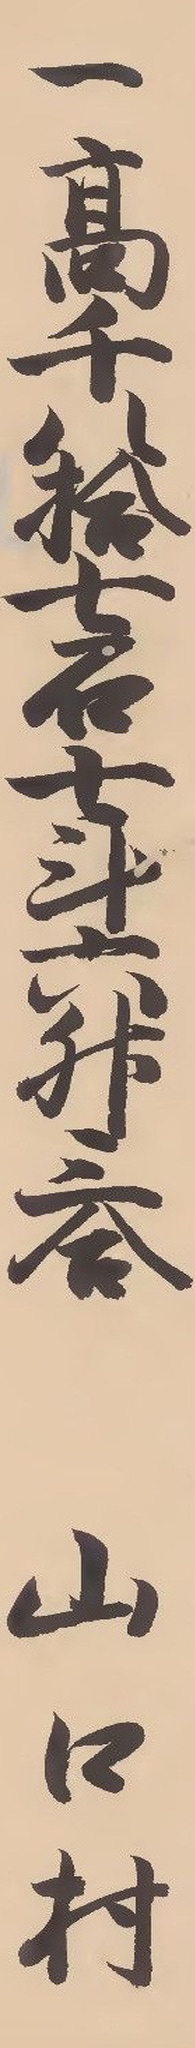一高千八拾七石七斗六升三合山口村
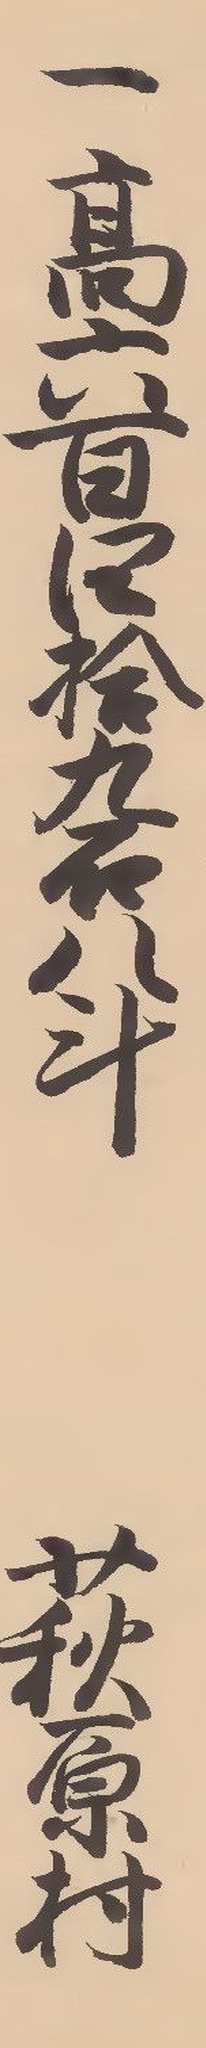一高六百四拾九石八斗萩原村
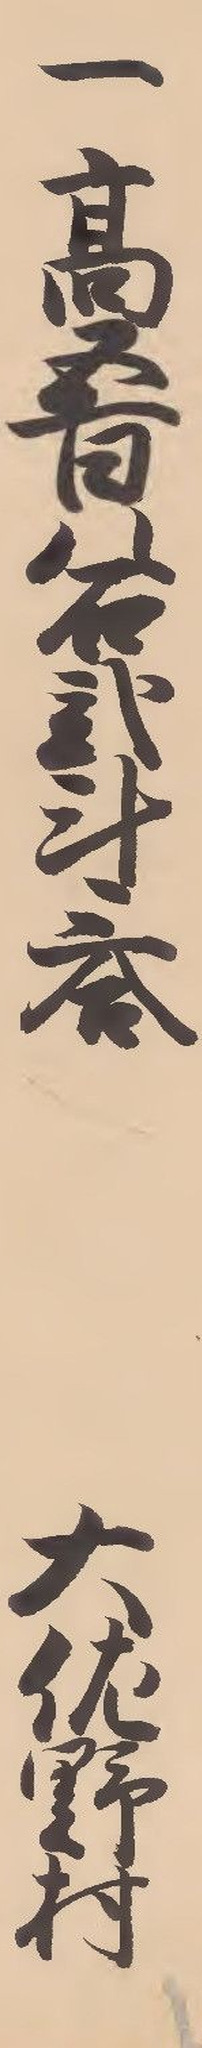一高五百八石弐斗三合大佐野村
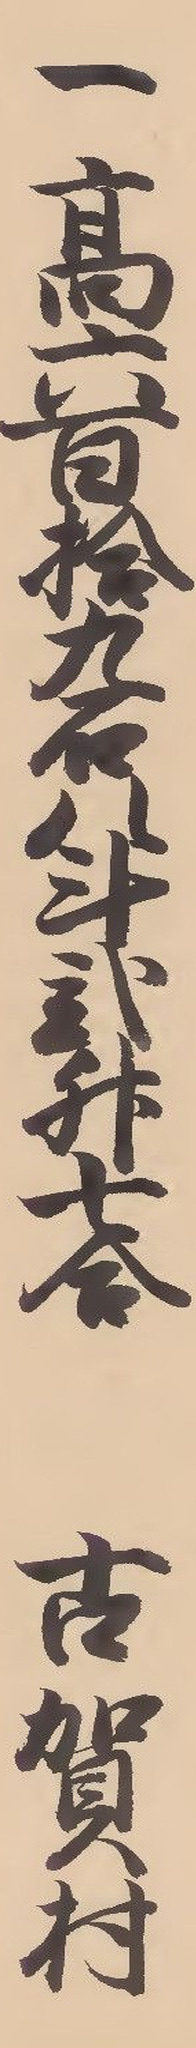一高六百拾九石八斗弐升七合古賀村

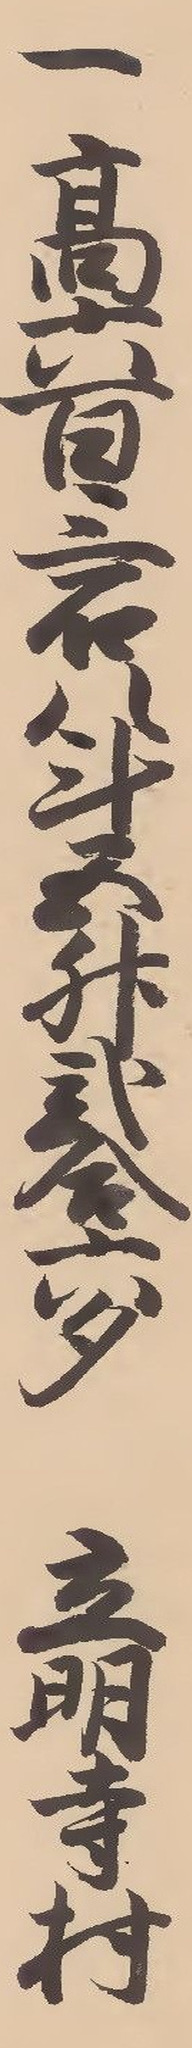一高六百三石八斗五升弐合六勺立明寺村
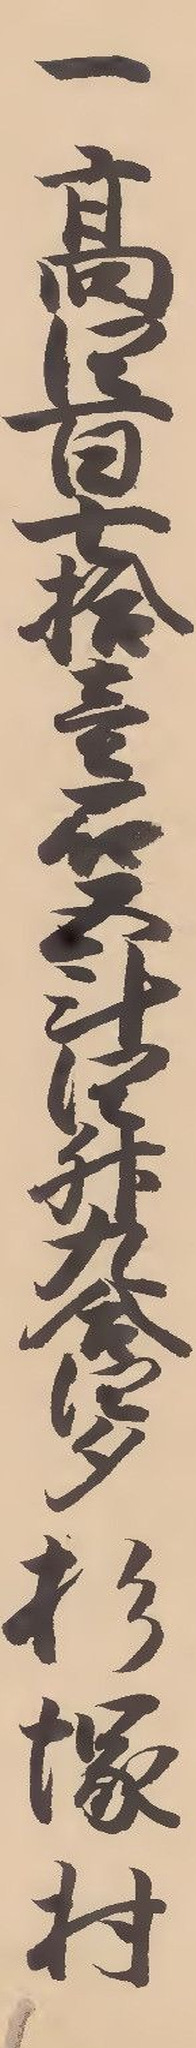一高四百七拾壱石五斗四升九合四勺杉塚村
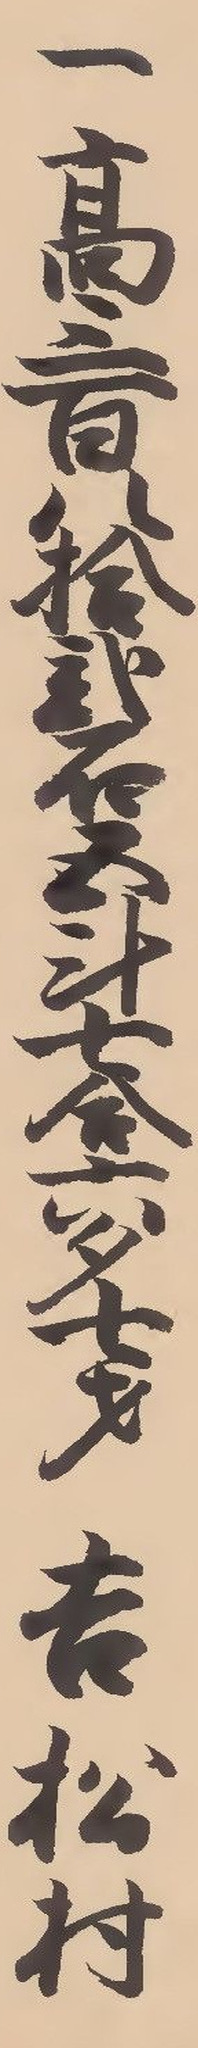一高三百八拾弐石五斗七合六勺七才吉松村
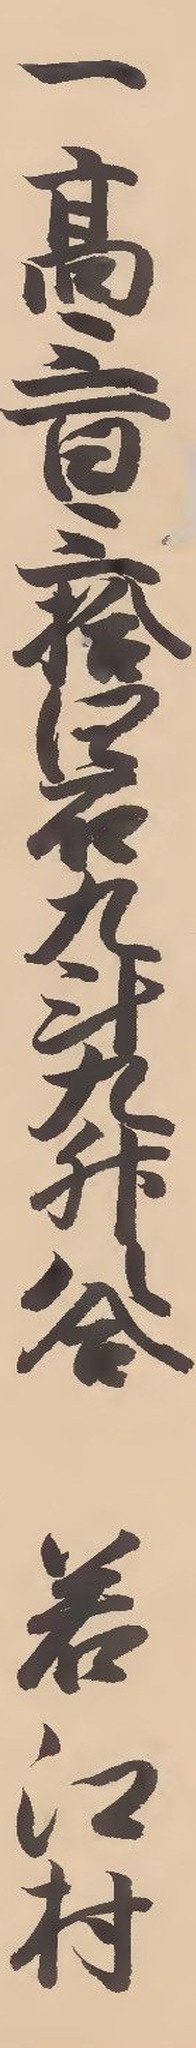一高三百三拾四石九斗九升八合若江村
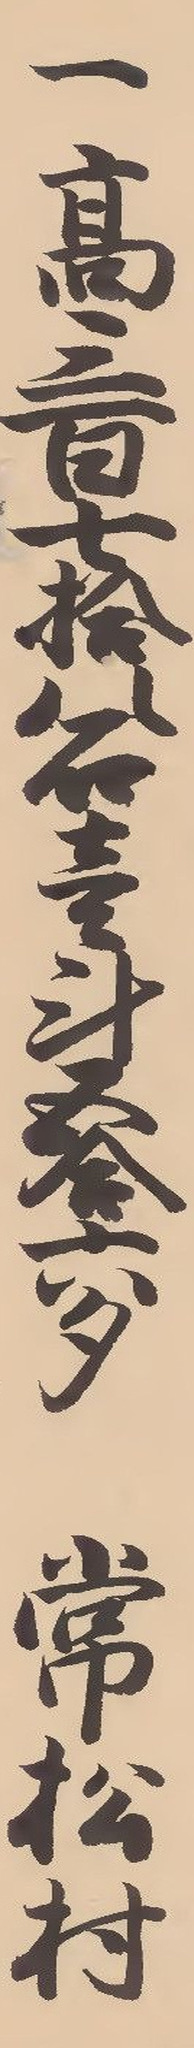一高三百七拾八石壱斗五合六勺常松村
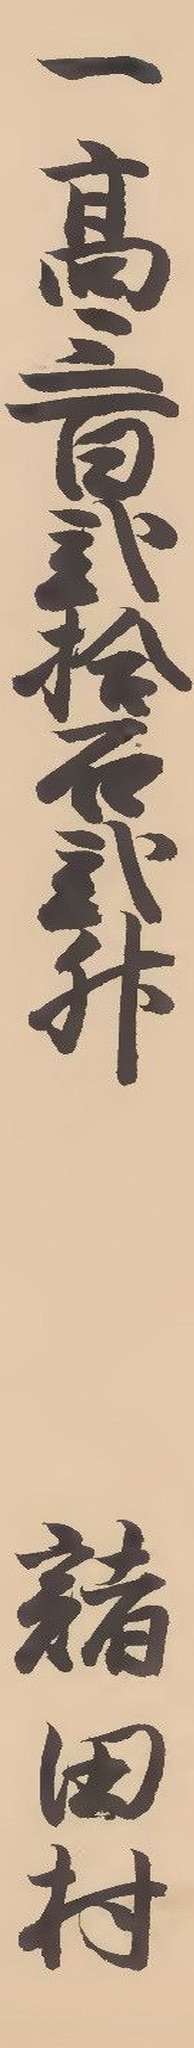一高三百弐拾石弐升諸田村
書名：筑前国郷帳
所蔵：国立公文書館 National Archives of Japan
